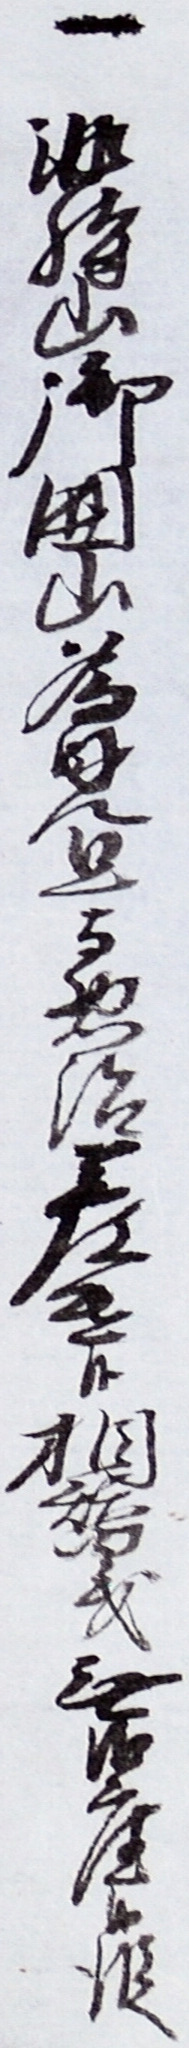一非持山御囲山為見廻与惣治差遣候相替之義無御座候様
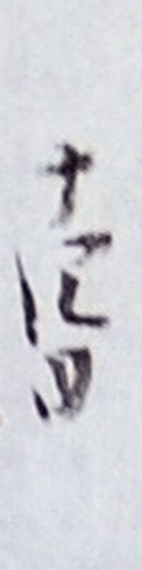十四日
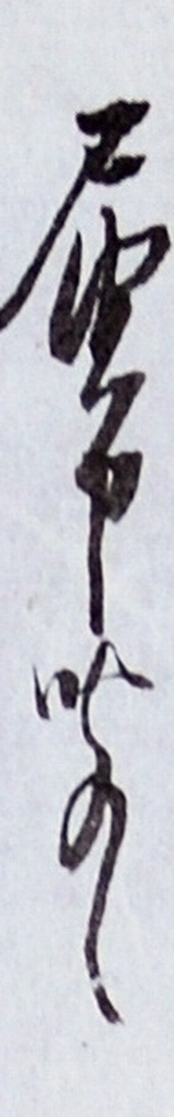届申聞候
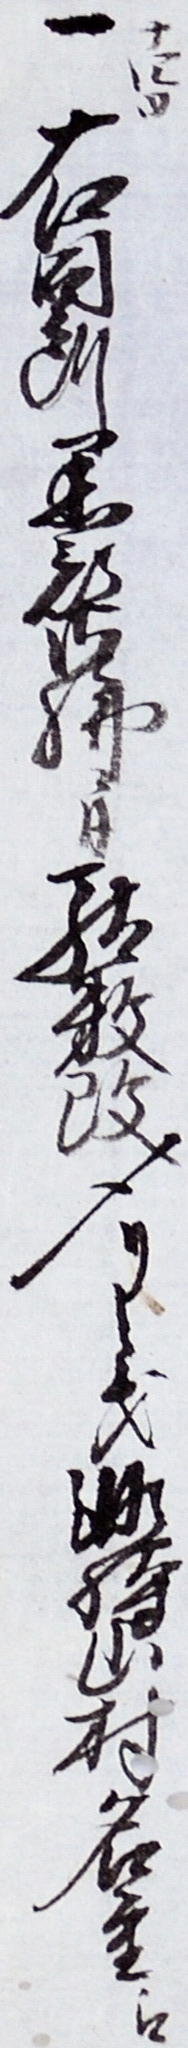一右同所黒部御払ニ付駄数改〆り之義非持山村之名主江
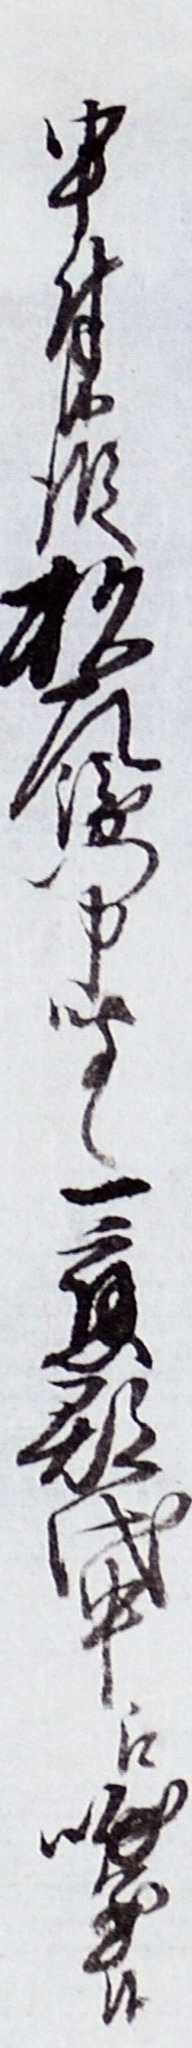申付候段杉左衛門申聞候一応郡代中江呼出候
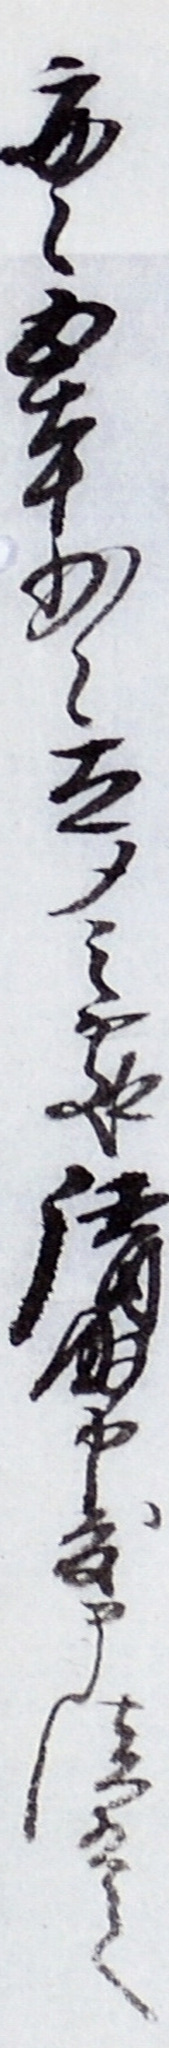亦々五本少々太メ之処請取申度申談有之候
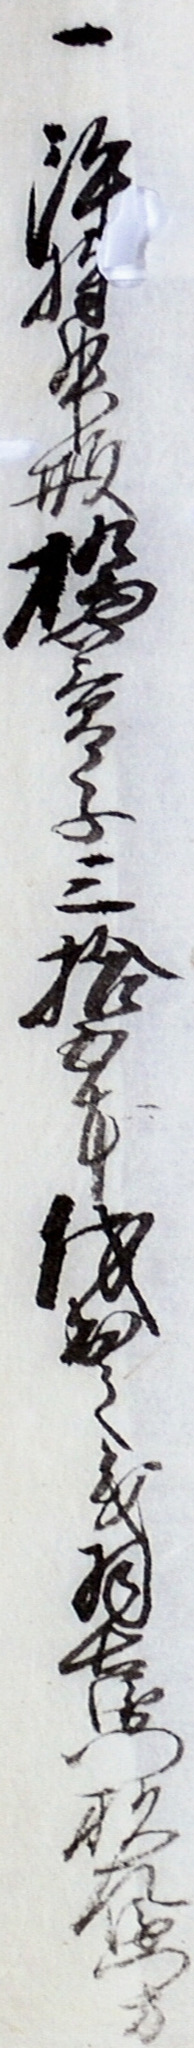一鉾持印形橋簀ノ子三拾五本伐出之義羽右衛門杉左衛門方
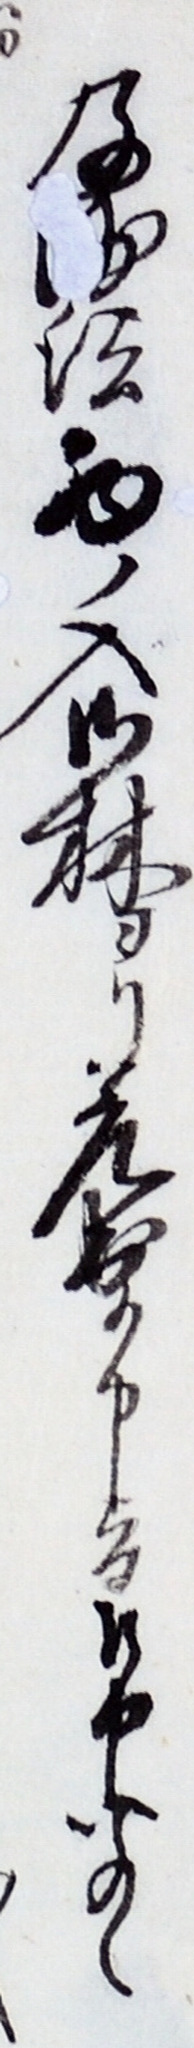及沙汰西ノ入御林ヨリ差出可申旨被申聞候
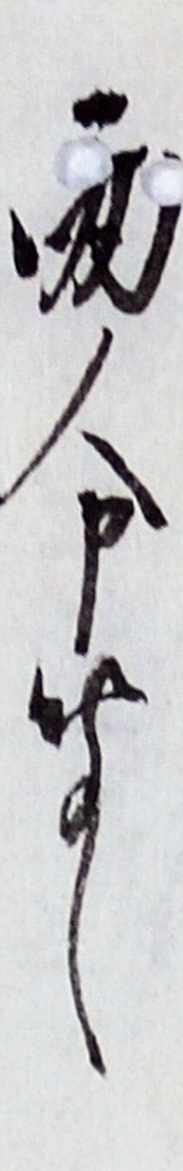両人申聞候
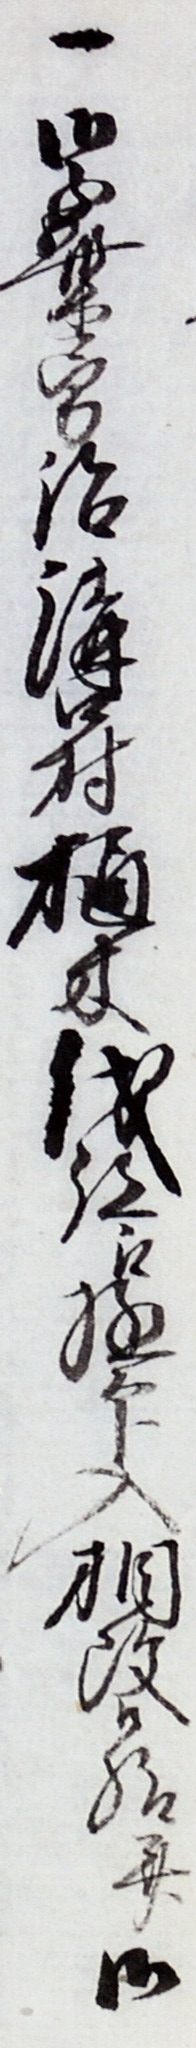一御子柴勇治溝口村樋木伐跡江極印入相改候様并御
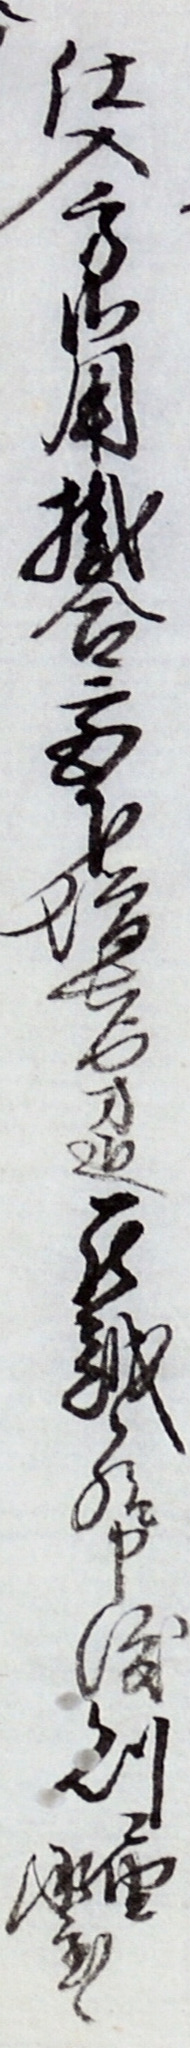仕入方御用掛合宮下増七衛門方迄罷越候様申渡則届承置候
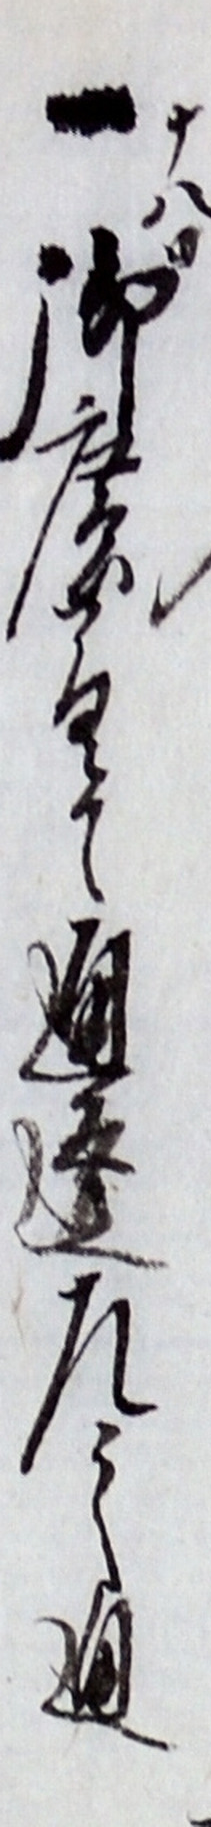一御広間ニて通達左之通
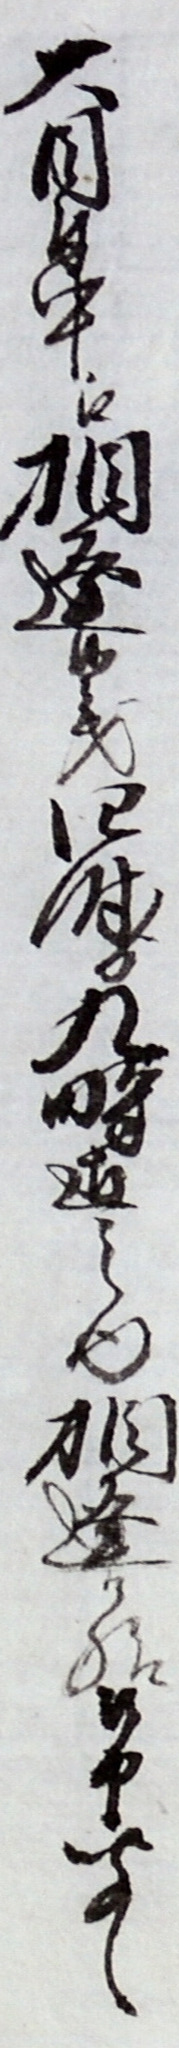一大目付中江相達申義四時より九時迄之内相達候様被申聞候
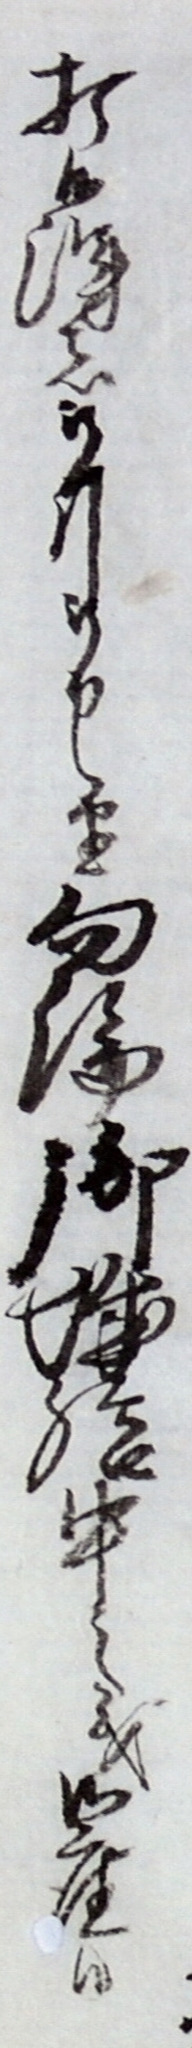打候得者被引被申候由勿論御城給中之義御座候
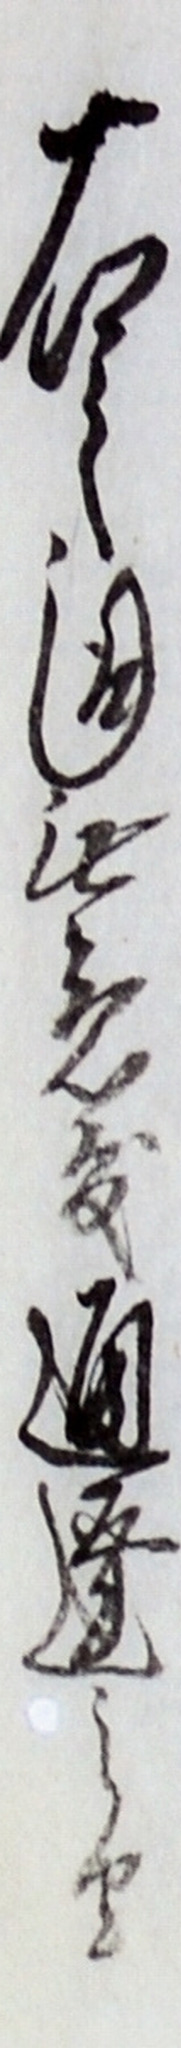右之趣無急度通達之由

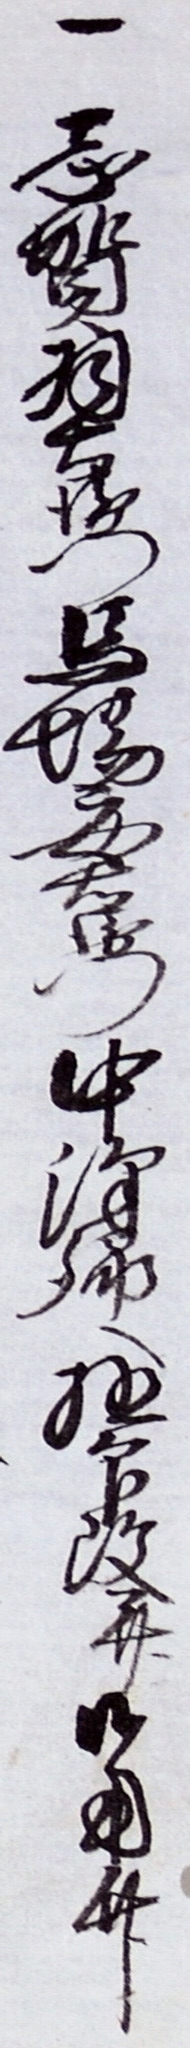一志賀羽右衛門馬場安右衛門中沢郷へ極印改并御用弁
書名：御山奉行御用控
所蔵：伊那市立高遠町図書館・合同会社AMANE
